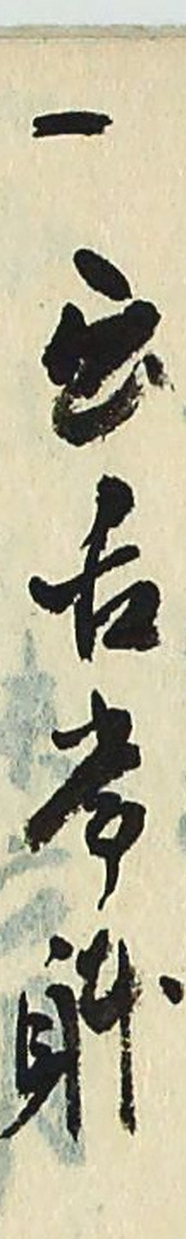一言舌常体
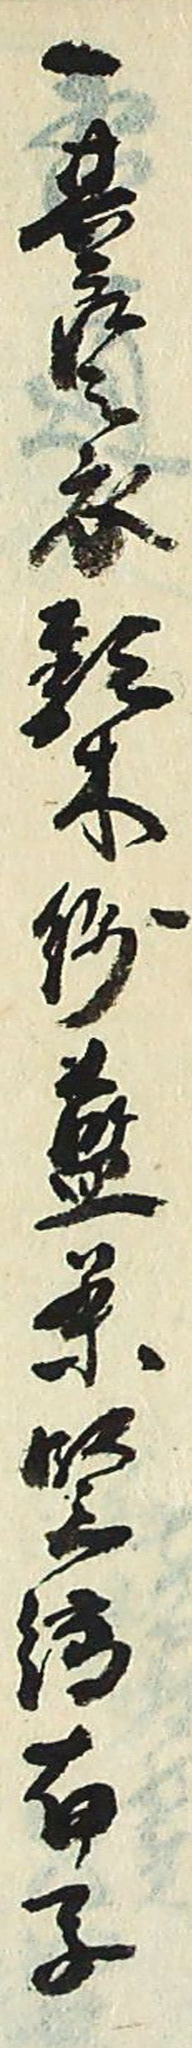一其節之衣類木綿藍茶竪縞布子
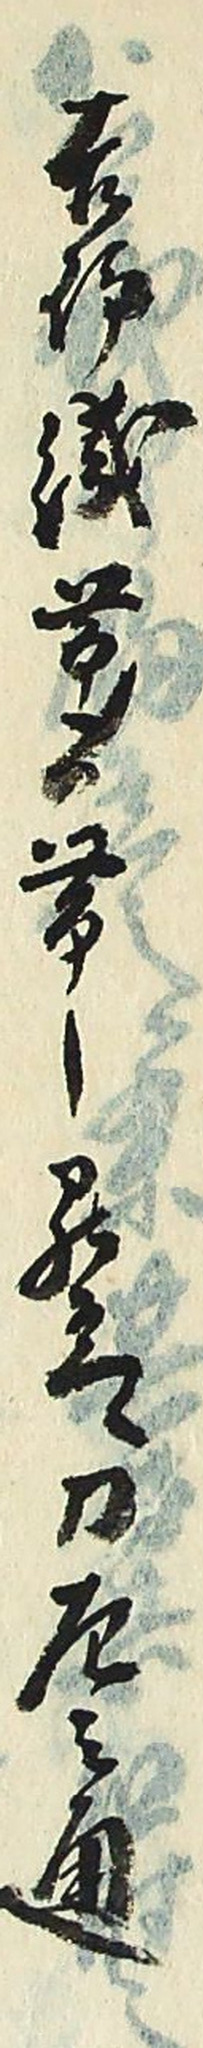吉野織帯〆帯し罷在候刀左之通
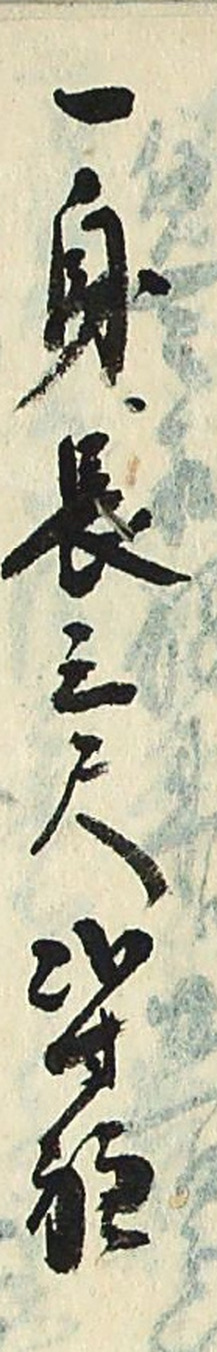一身長三尺弐寸程
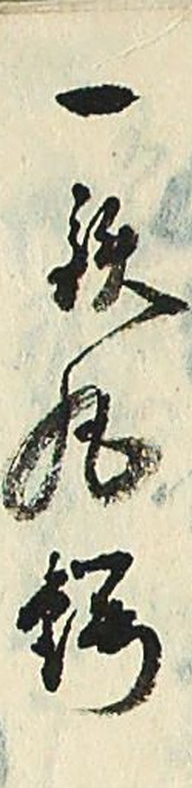一鉄丸鍔

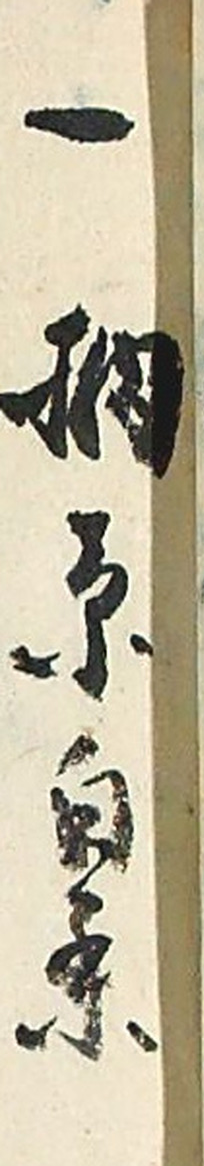一柄糸白茶
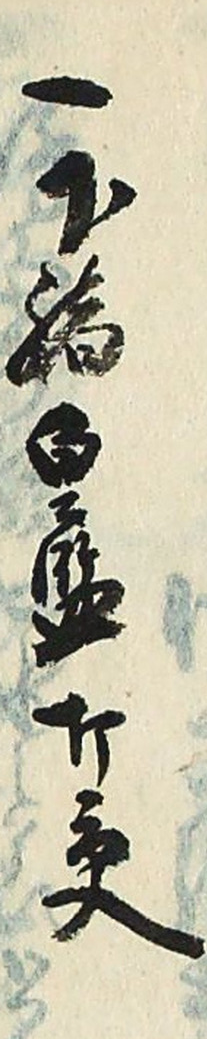一下緒白藍打交
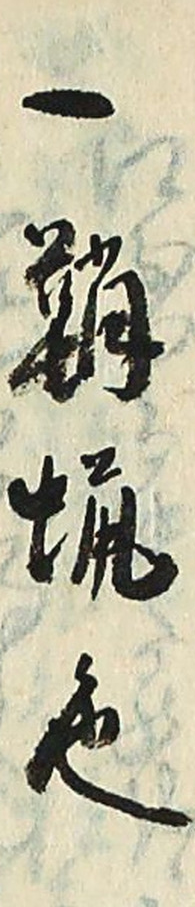一鞘蝋色
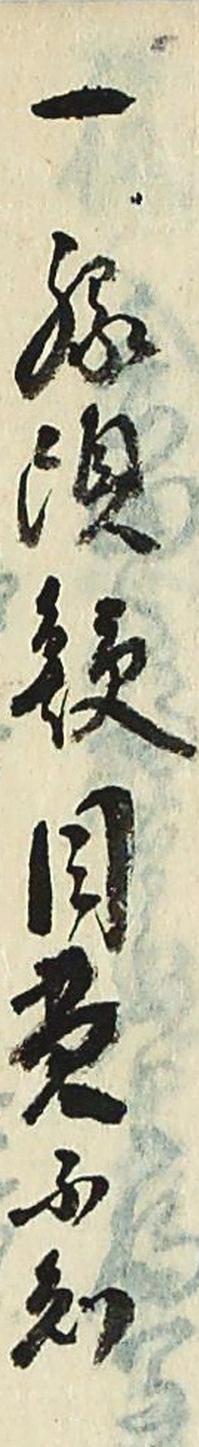一縁頭鮫目貫不知
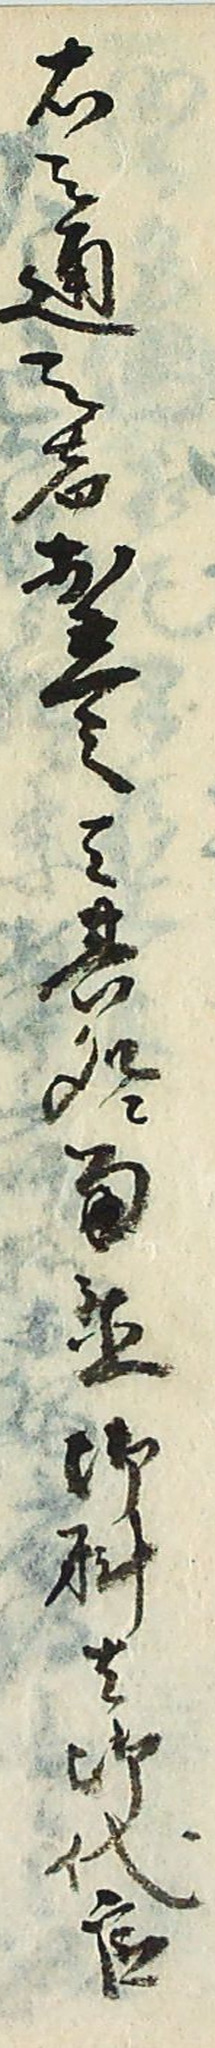右之通之者於有之は其処に留置御料は御代官
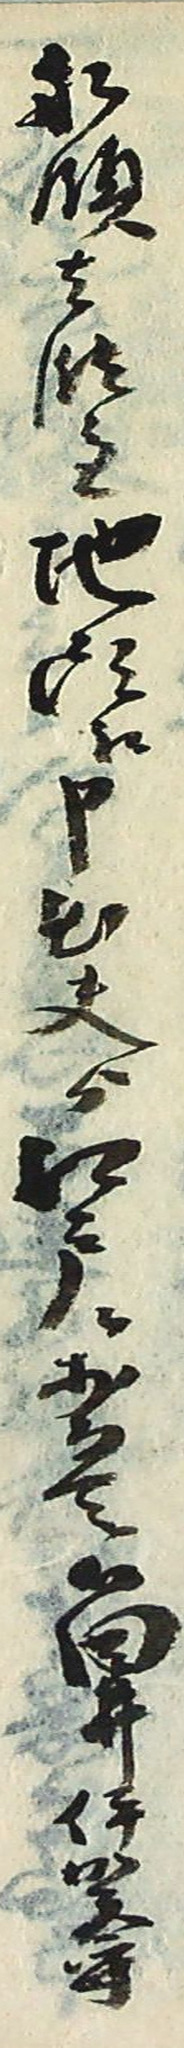私領は領主地頭江申出夫ゟ江戸におゐて筒井伊賀守
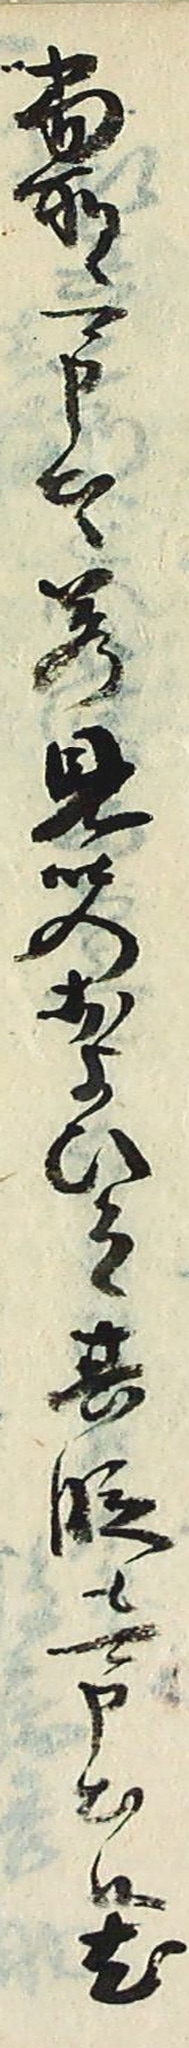当所へ可申出候若見聞およひ候はゝ其段も可申出候尤
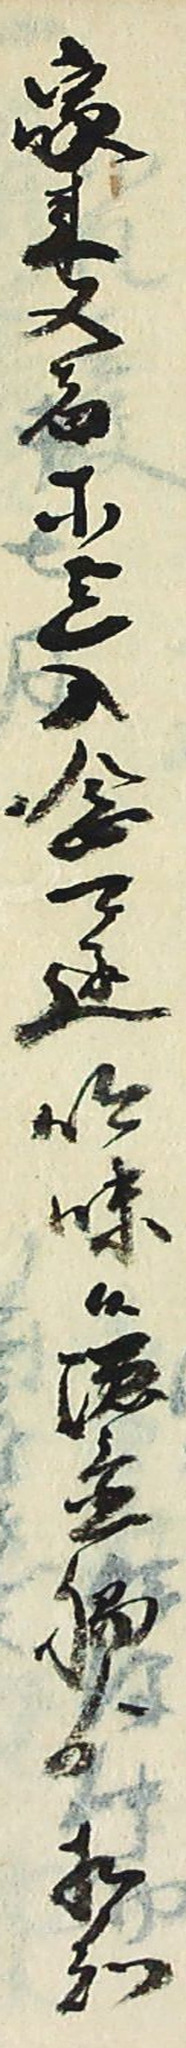家来又者等迄入念可遂吟味候隠置脇ゟ相知
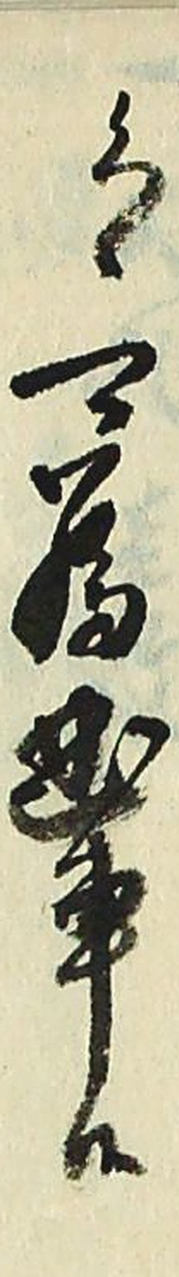候はゝ可為曲事候
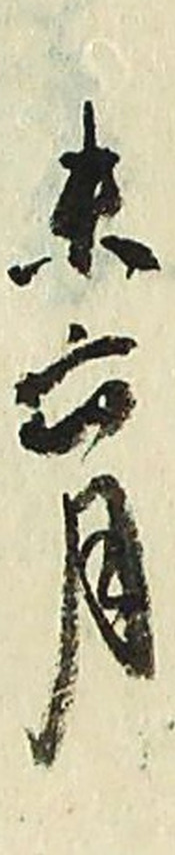未六月
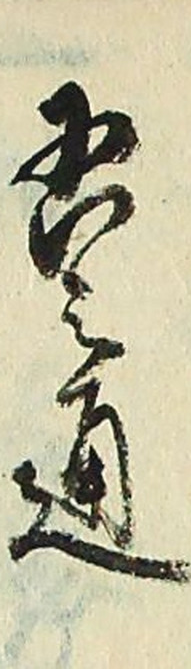右之通
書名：諸御用御□受書控
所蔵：鳴門教育大学 Naruto University of Education
